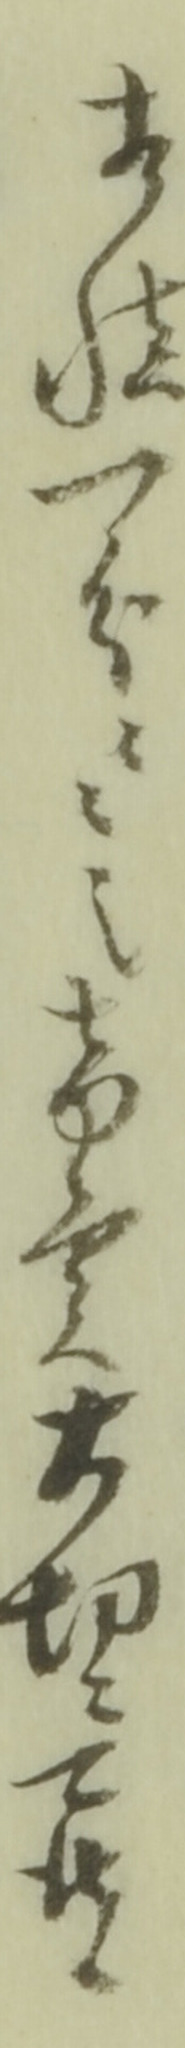相慎一分〃〃之商売大切二可仕候
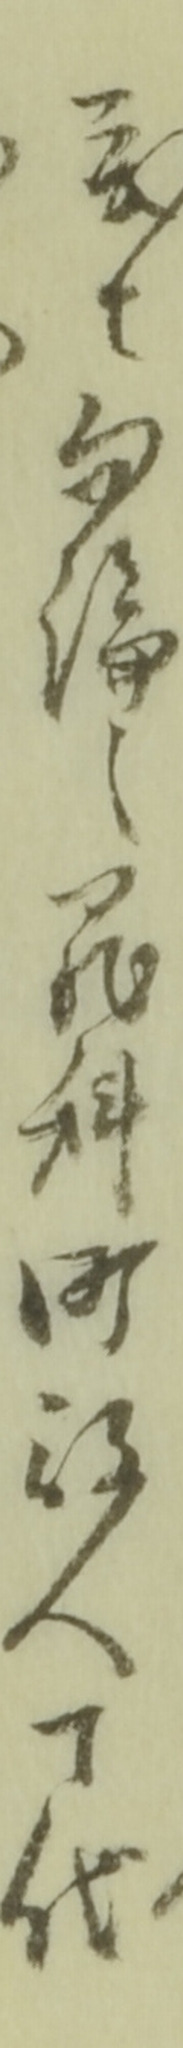義者勿論之罪科町役人丁代
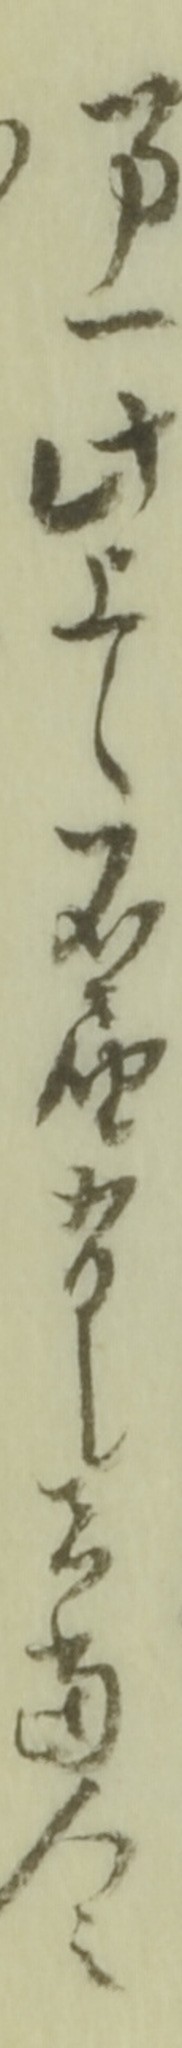万一此上之不届有之者当人之
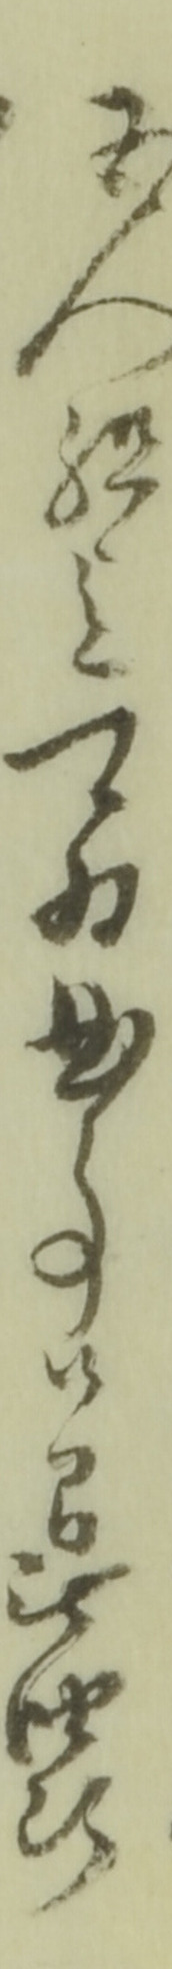五人組迄可為出事候間無
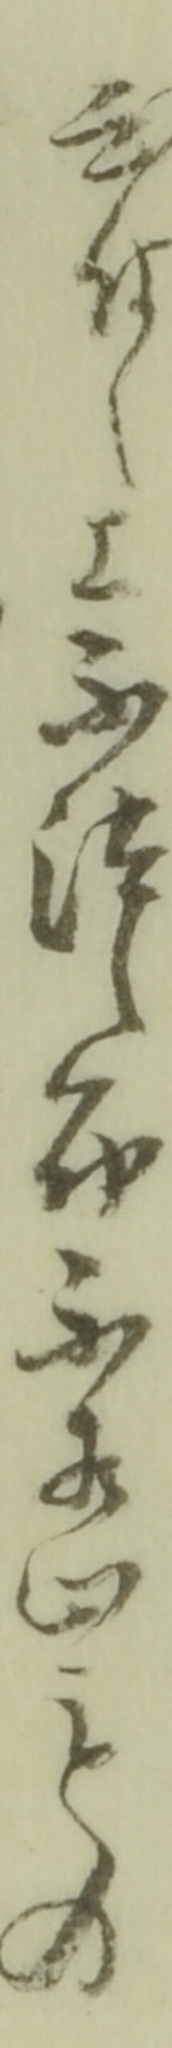付候上不法の筋不相正もの
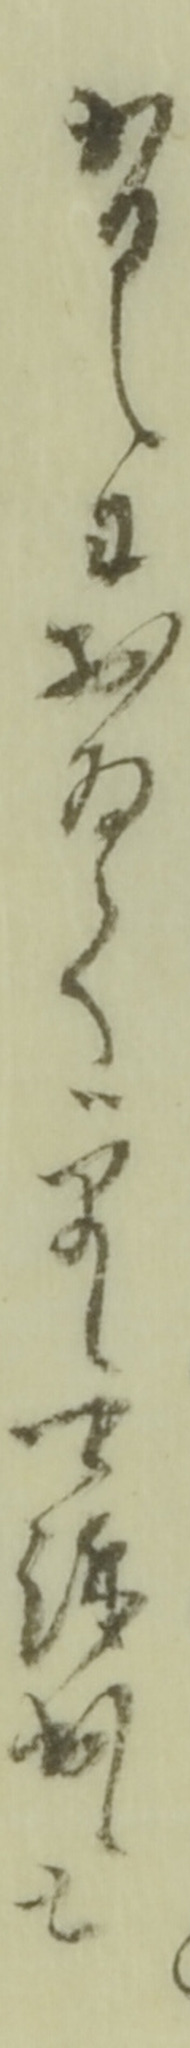有之者おなしく早々可訴出候以上
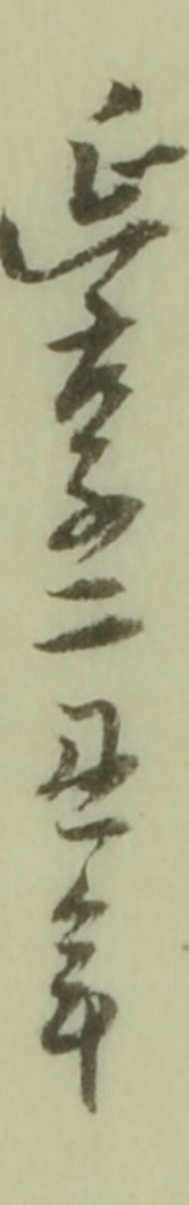延享二丑年
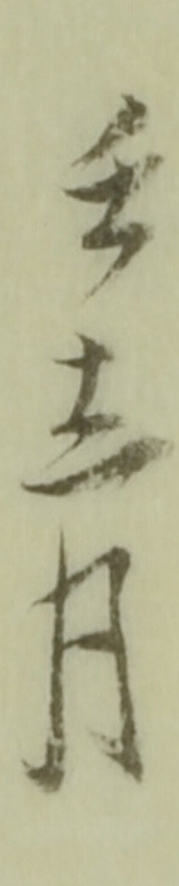壬十二月

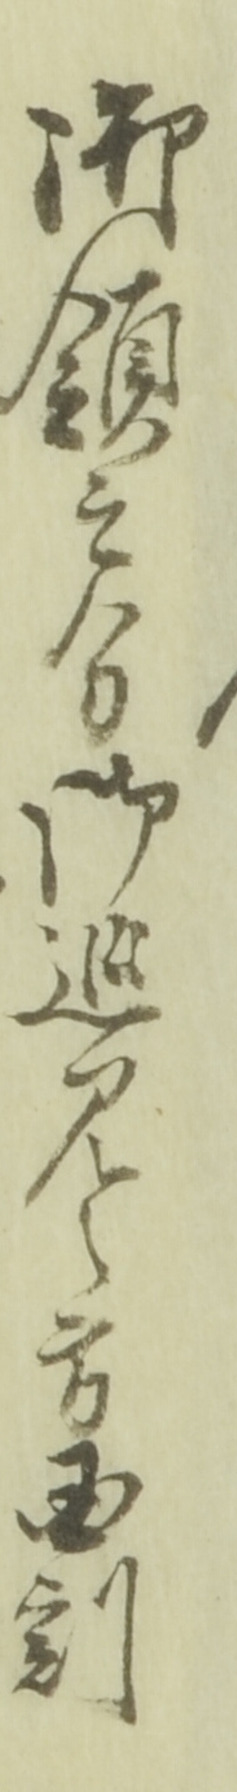御領之分御巡見之方国割
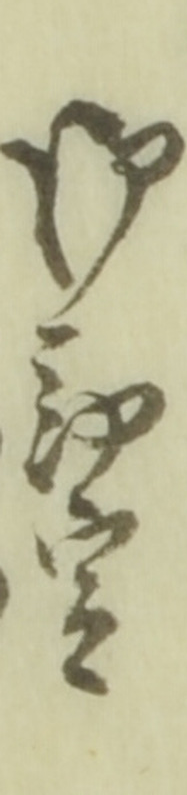御勤定
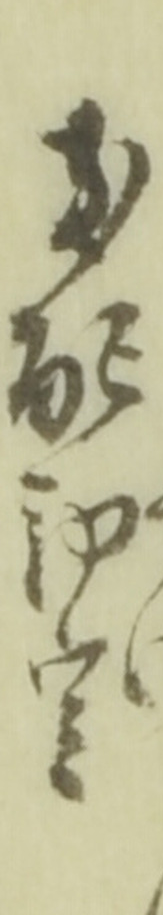支配決定
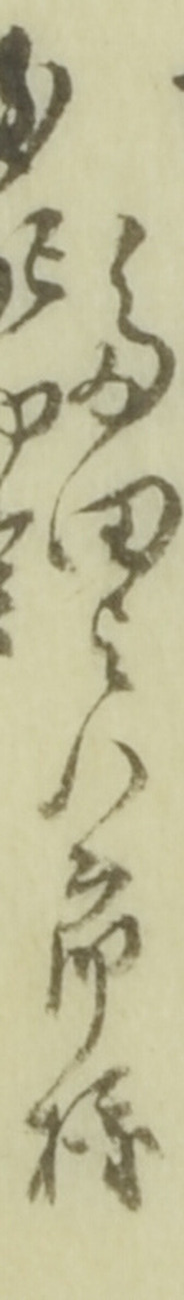多田与八郎様
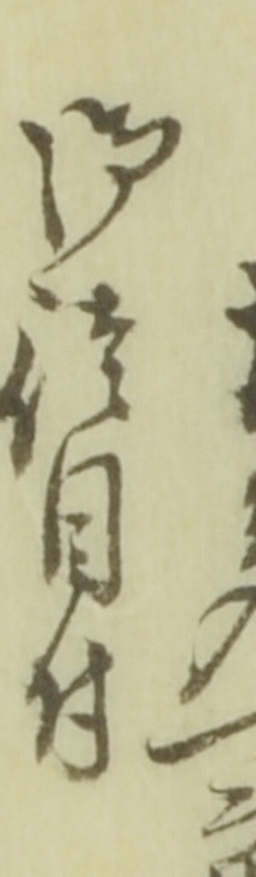御領目付
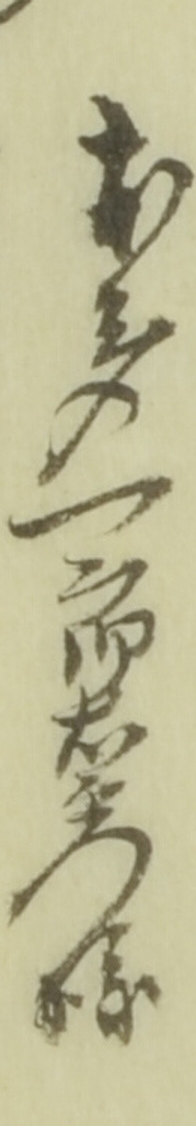本多一郎右衛門様
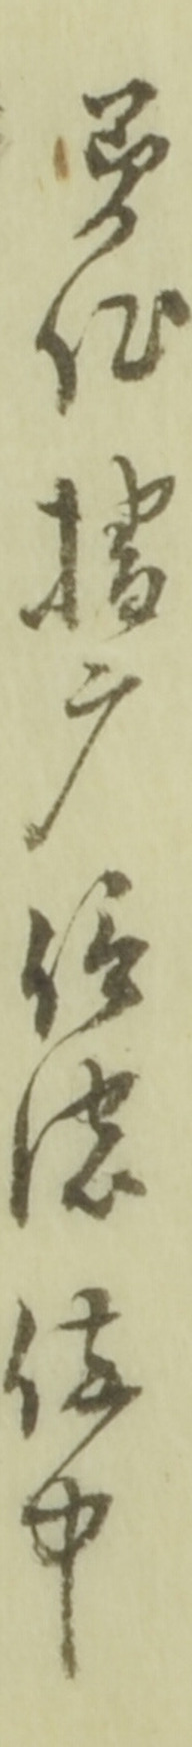美濃播磨信濃備中
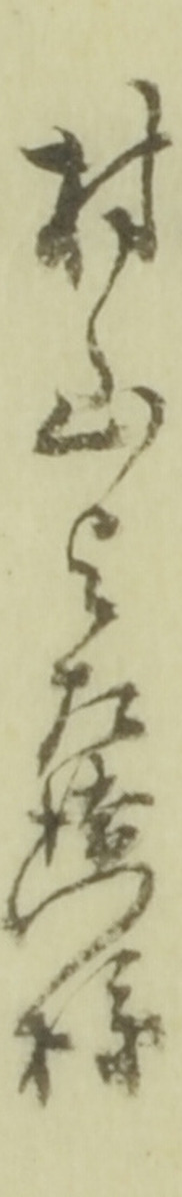村山与左右衛門様
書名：御公儀様御領主様御触書控
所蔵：伊那市立高遠町図書館・合同会社AMANE
